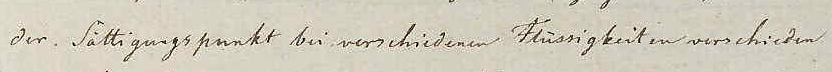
der Sättigungspunkt bei verschiedenen Flüssigkeiten verschieden
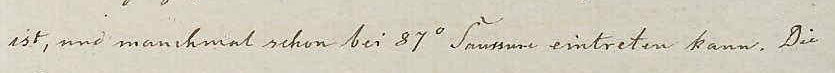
ist, und manchmal schon bei 87° Saussure eintreten kann. Die
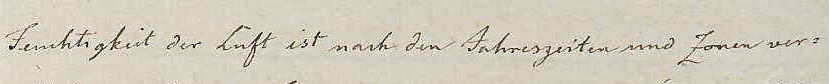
Feuchtigkeit der Luft ist nach den Jahreszeiten und Zonen ver-
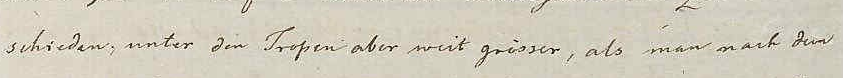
schieden; unter den Tropen aber weit grösser, als man nach dem
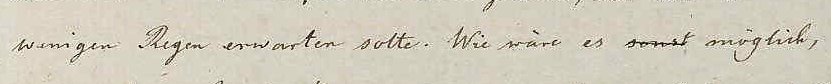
wenigen Regen erwarten solte. Wie wäre es sonst möglich,
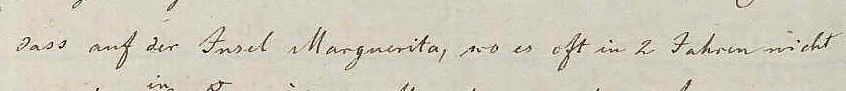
dass auf der Insel Marguerita, wo es oft in 2 Jahren nicht
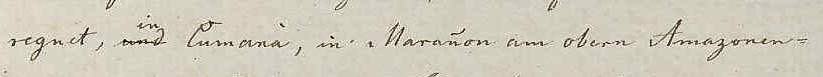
regnet, undin Cumanà, in Marañon am obern Amazonen-
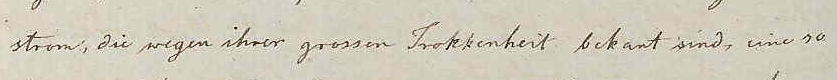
strom, die wegen ihrer grossen Trokkenheit bekant sind, eine so
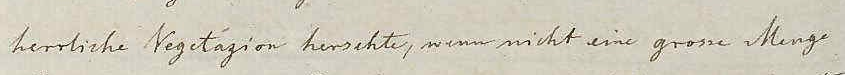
herrliche Vegetazion herschte, wenn nicht eine grosse Menge
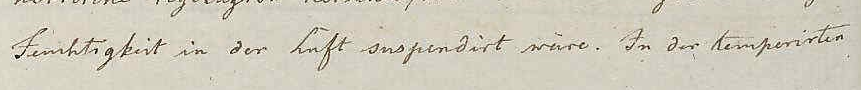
Feuchtigkeit in der Luft suspendirt wäre. In der temperirten
